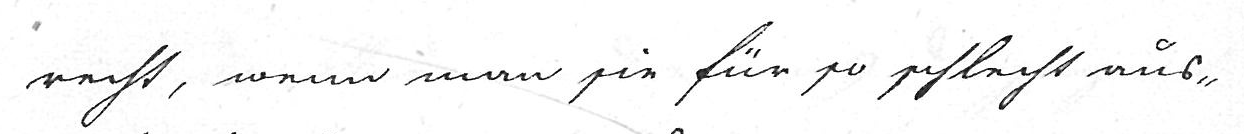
recht, wenn man sie für so schlecht aus-
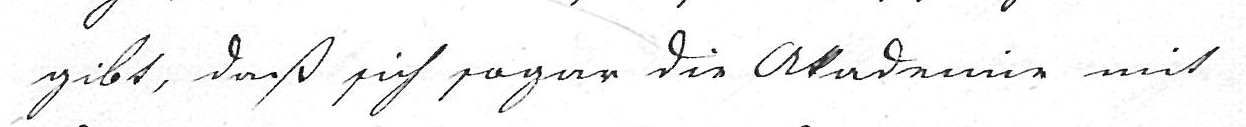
gibt, daß sich sogar die Akademie mit
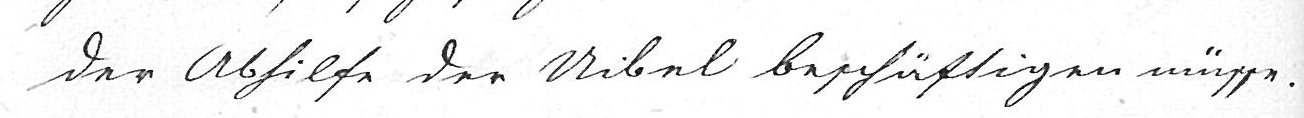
der Abhilfe der Uibel beschäftigen müsse.
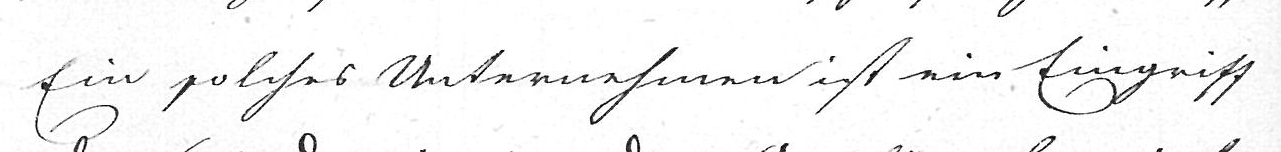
Ein solches Unternehmen ist ein Eingriff
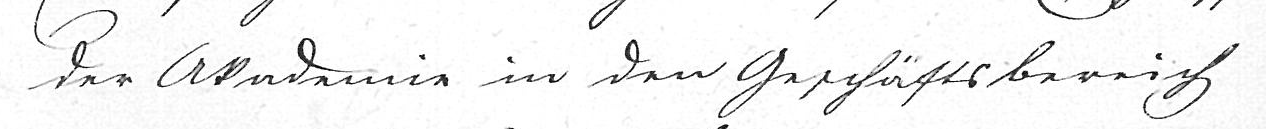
der Akademie in den Geschäftsbereich
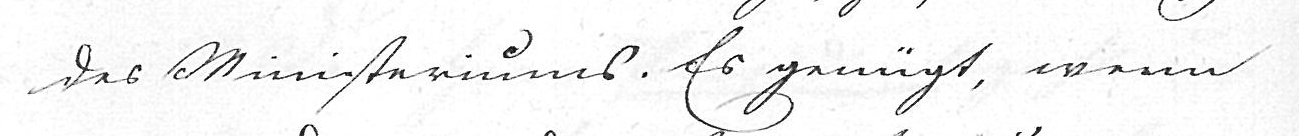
des Ministeriums. Es genügt, wenn
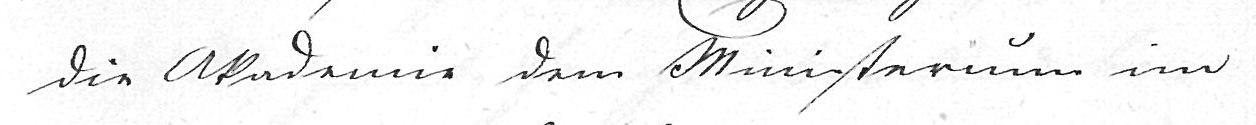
die Akademie dem Ministerium im
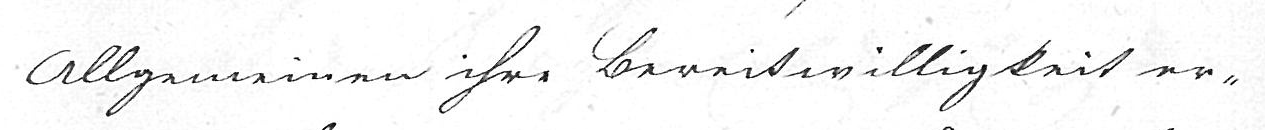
Allgemeinen ihre Bereitwilligkeit er-
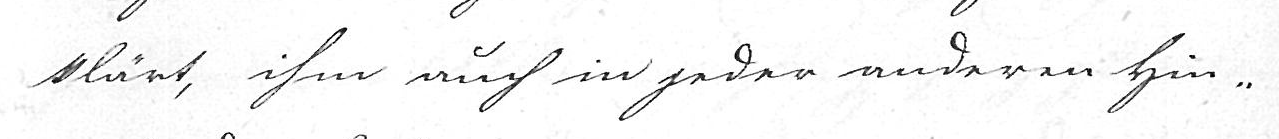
klärt, ihm auch in jeder anderen Hin-
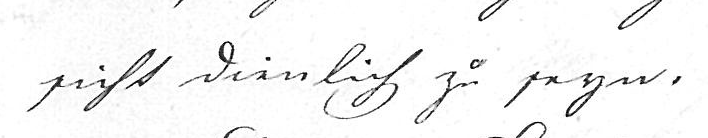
sicht dienlich zu seyn.
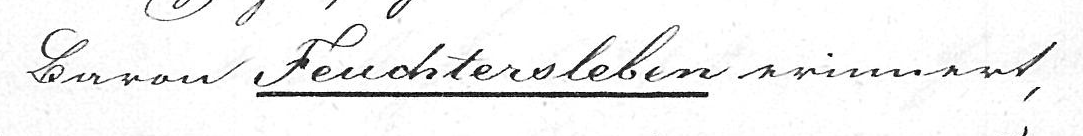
Baron Feuchtersleben erinnert,
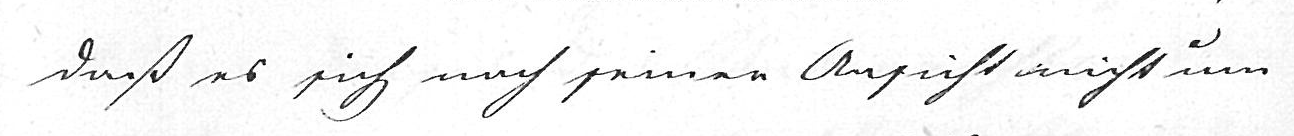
daß es sich nach seiner Ansicht nicht um
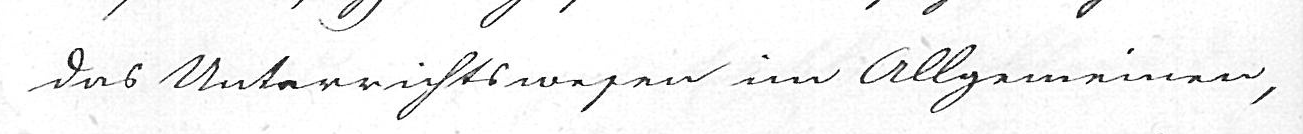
das Unterrichtswesen im Allgemeinen,
